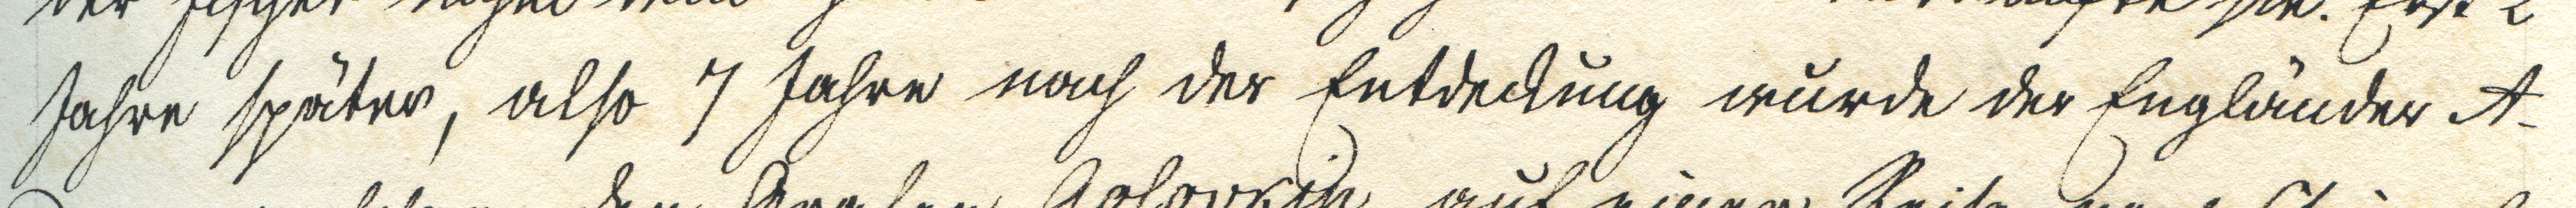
Jahr später, also 7 Jahre nach der Entdeckung wurde der Engländer A-
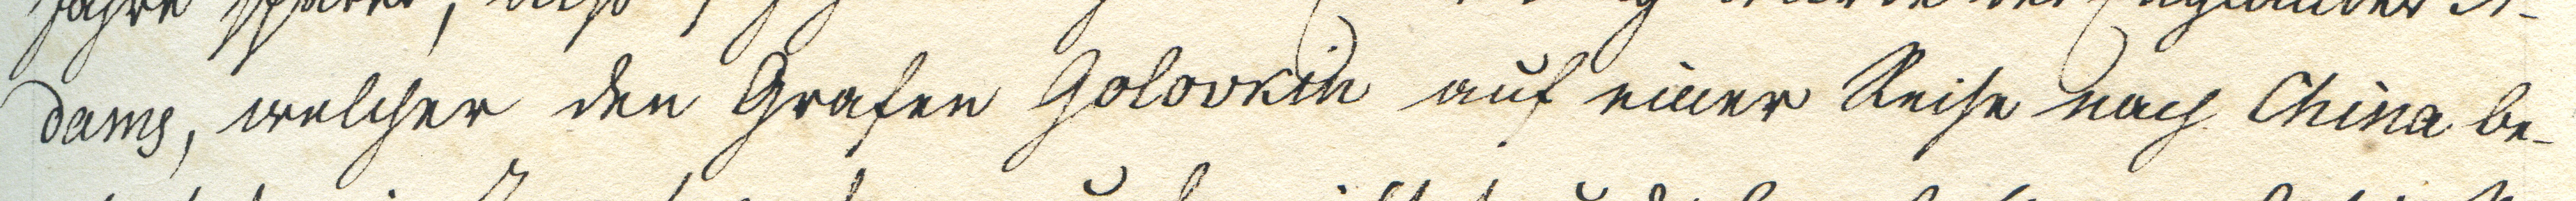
dams, welcher den Grafen Golovkin auf einer Reise nach China be-
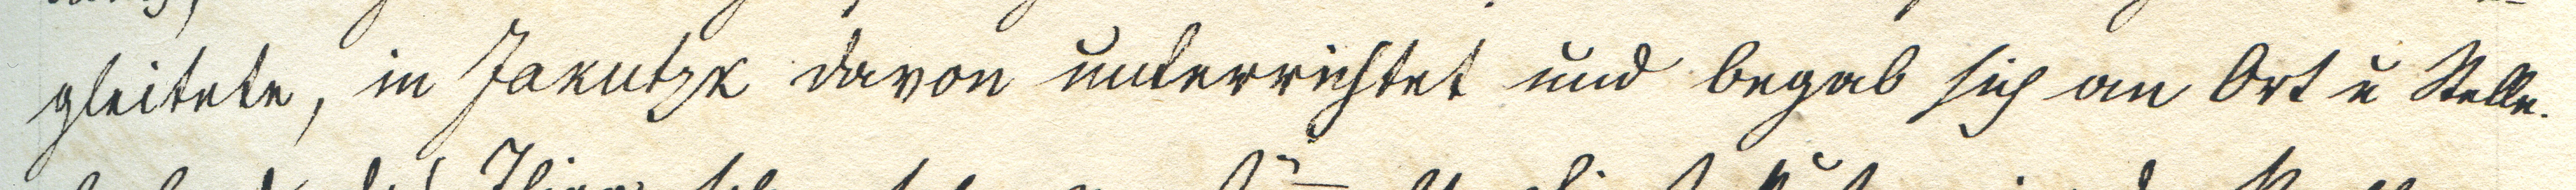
gleitete, in Jakutzk davon unterrichtet und begab sich an Ort u Stelle.
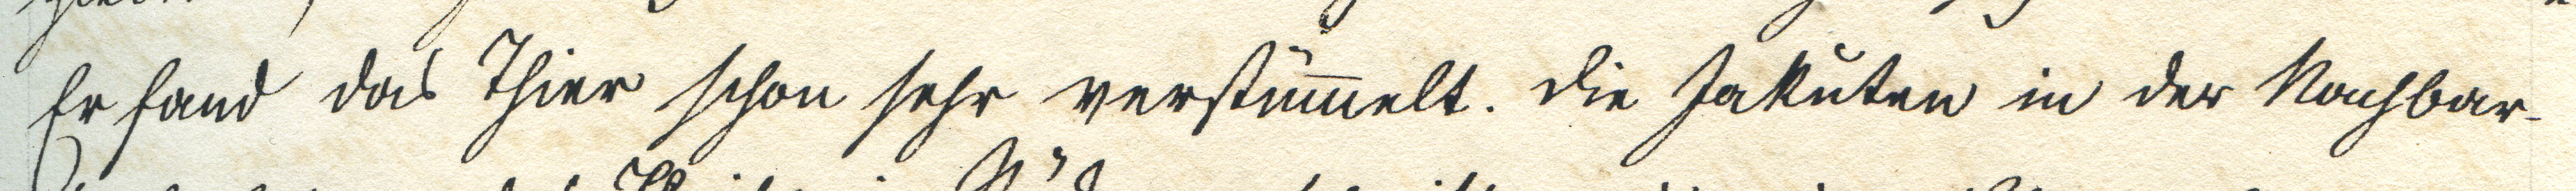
Er fand das Thier schon sehr verstüm̃elt. Die Jakuten in der Nachbar-
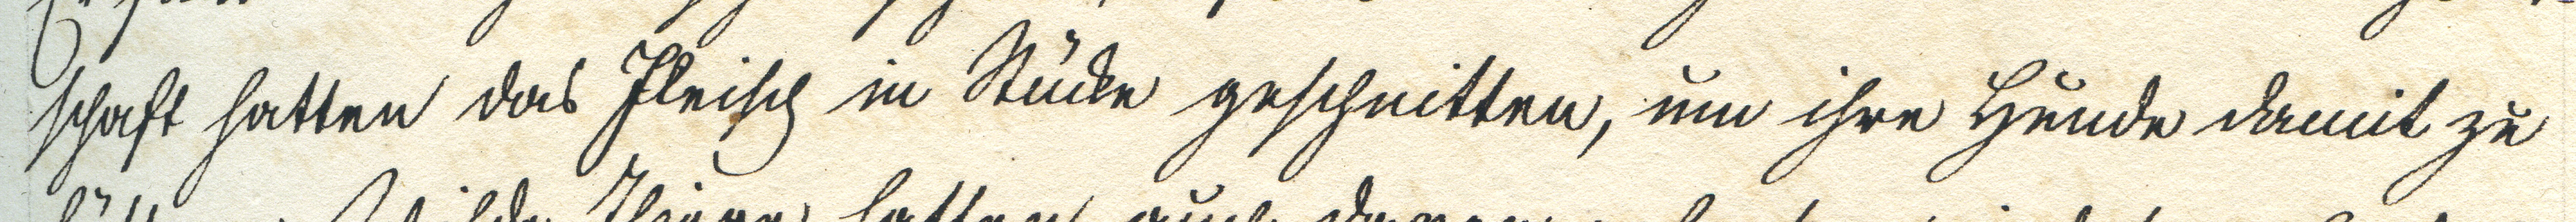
schaft hatten das Fleisch in Stücke geschnitten, um ihre Hunde damit zu
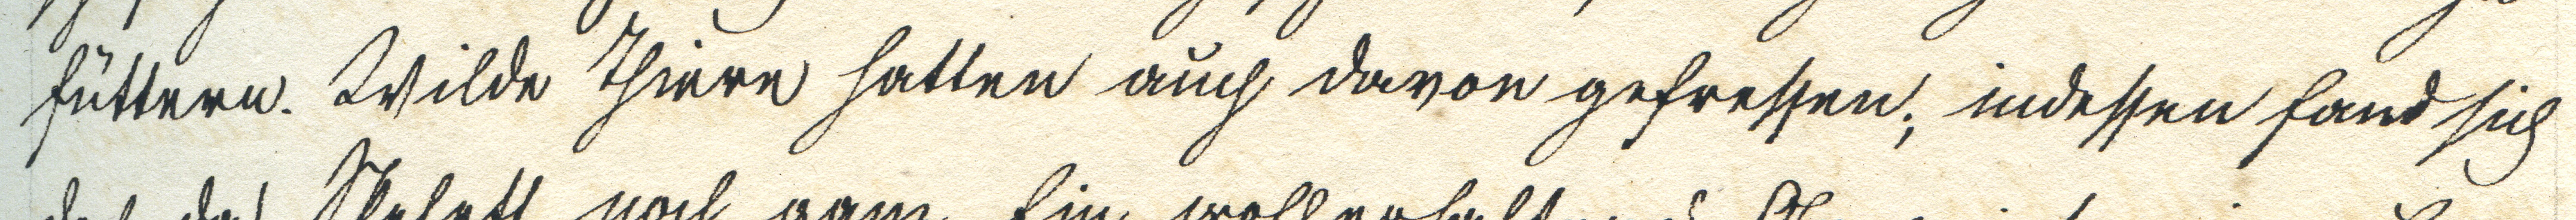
füttern. Wilde Thiere hatten auch davon gefressen; indessen fand sich
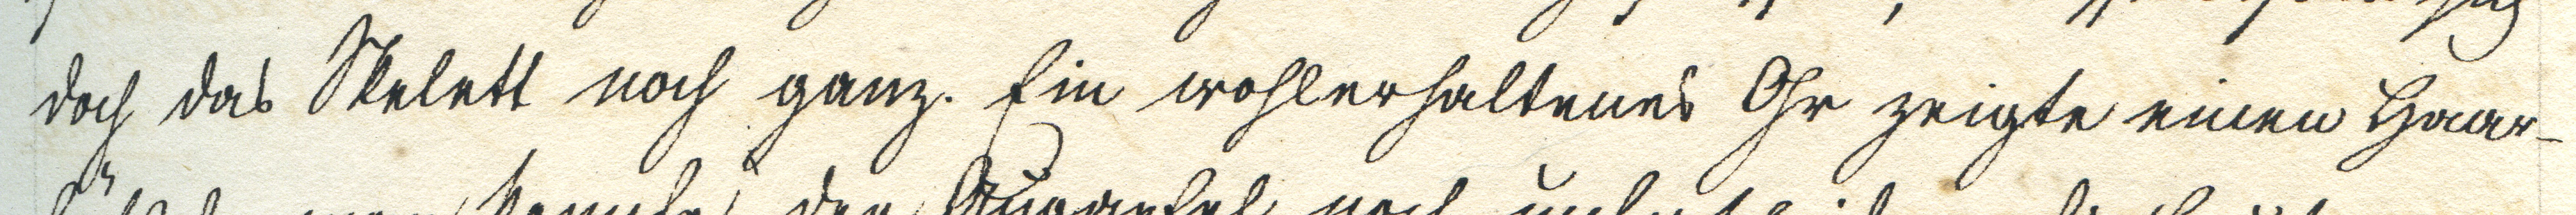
doch das Skelett noch ganz. Ein wohlerhaltenes Ohr zeigte einen Haar-
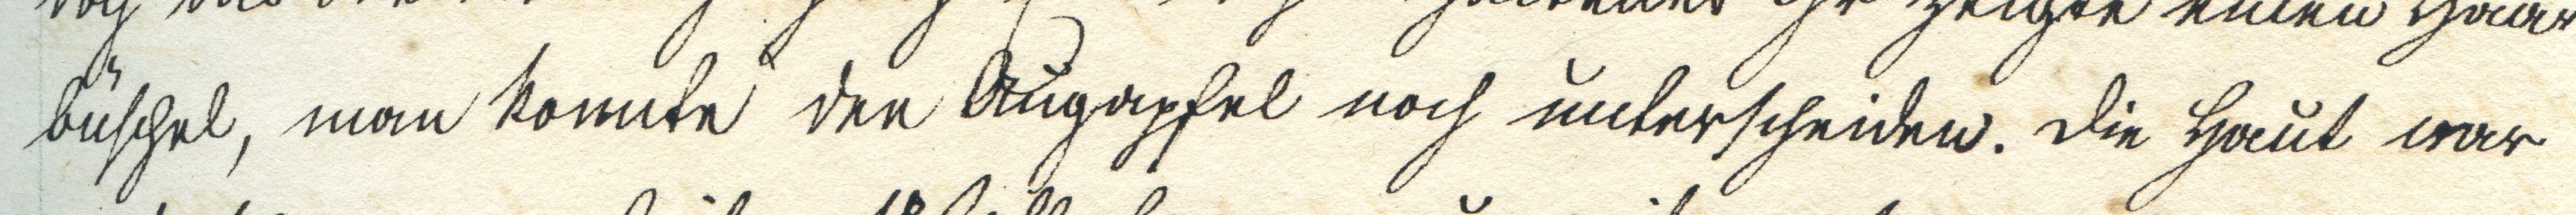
büschel, man konnte den Augapfel noch unterscheiden. Die Haut war
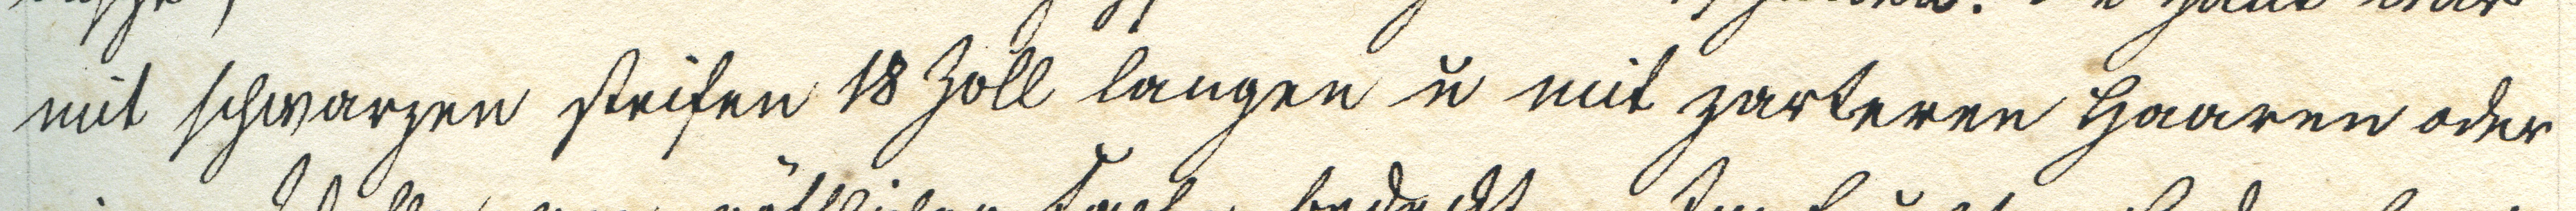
mit schwarzen steifen 18 Zoll langen u mit zarteren Haaren oder
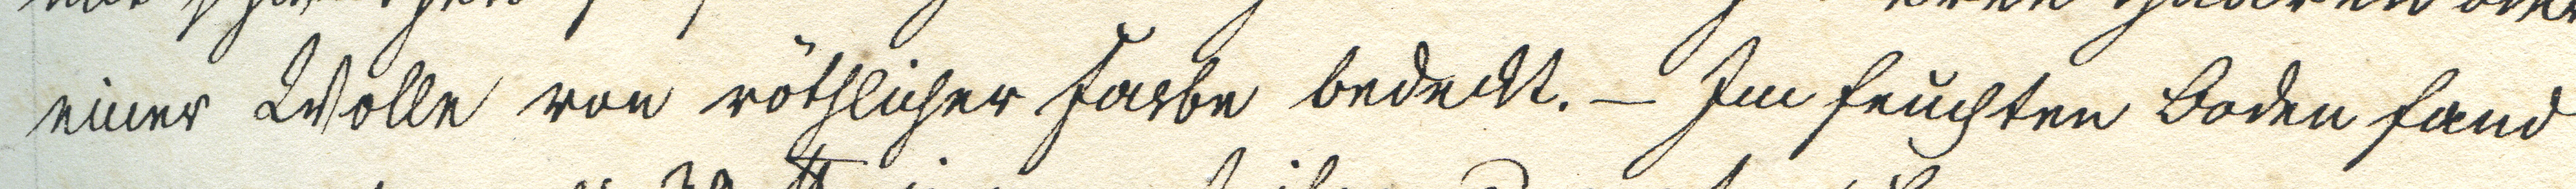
einer Wolle von röthlicher Farbe bedeckt. – Im feuchten Boden fand
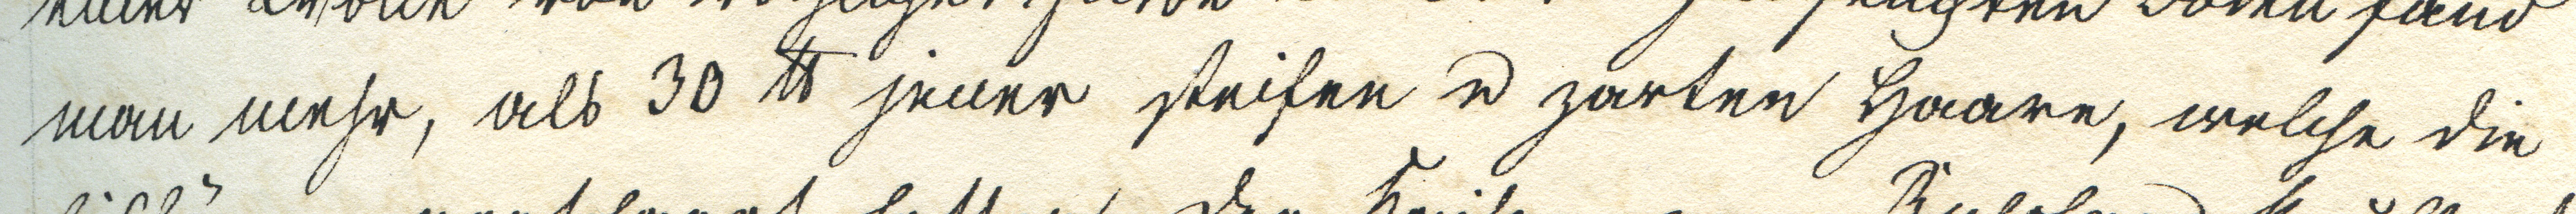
man mehr, als 30 ℔ jener steifen und zarten Haare, welche die
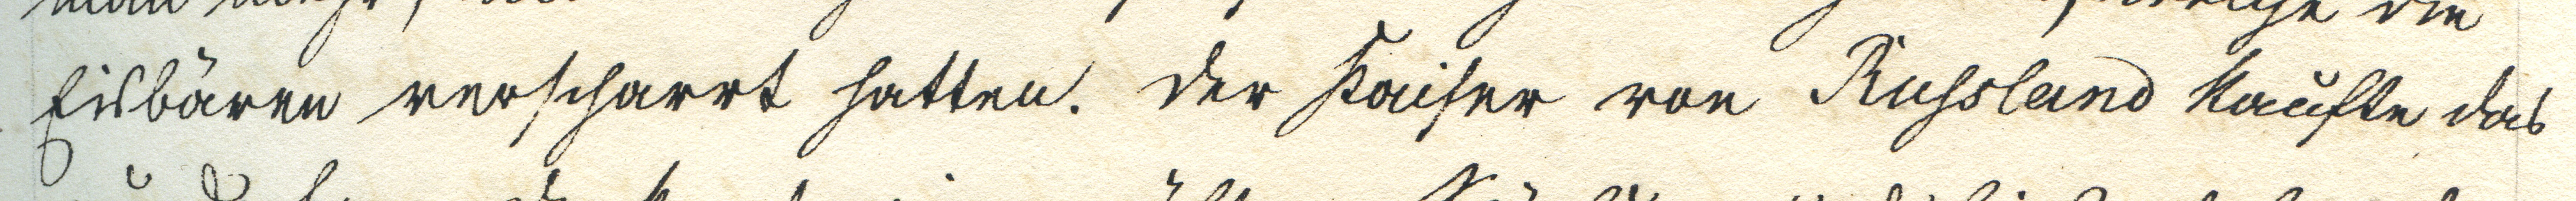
Eisbären verscharrt hatten. Der Kaiser von Russland kaufte das
